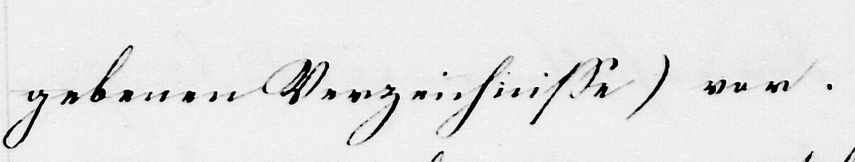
gebenen Verzeichniße) vor.
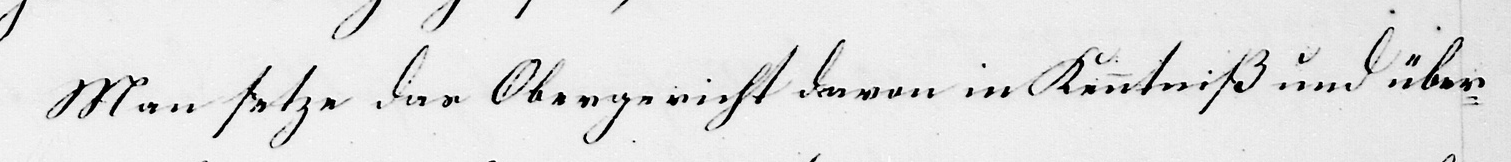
Man setze das Obergericht davon in Kenntniß und über¬
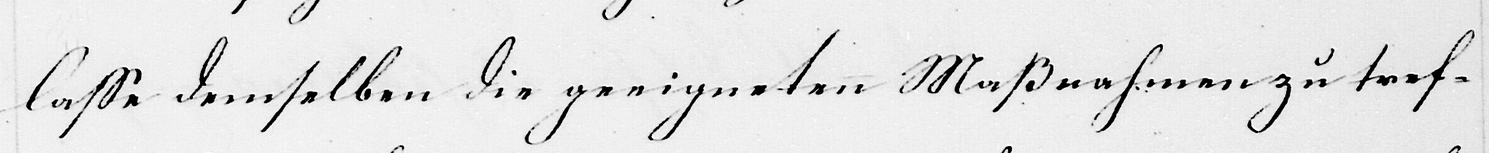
laße demselben die geeigneten Maßnahmen zu tref¬
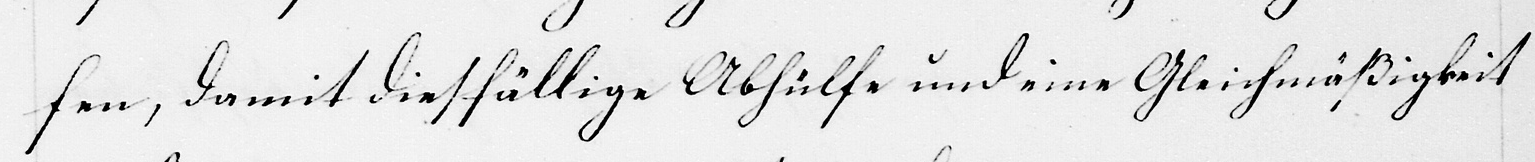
fen, damit diesfällige Abhülfe und eine Gleichmäßigkeit
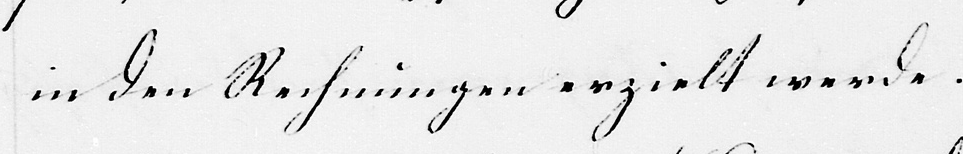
in den Rechnungen erzielt werde.
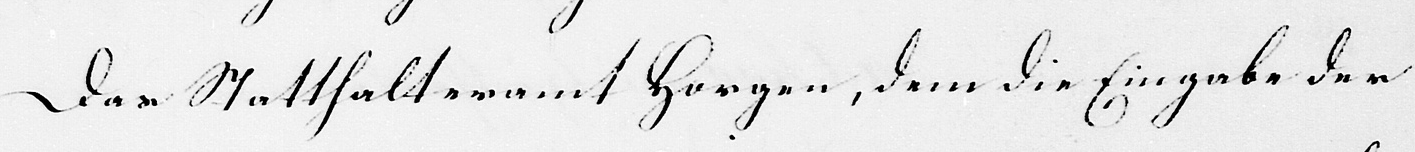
Das Statthalteramt Horgen, dem die Eingabe der
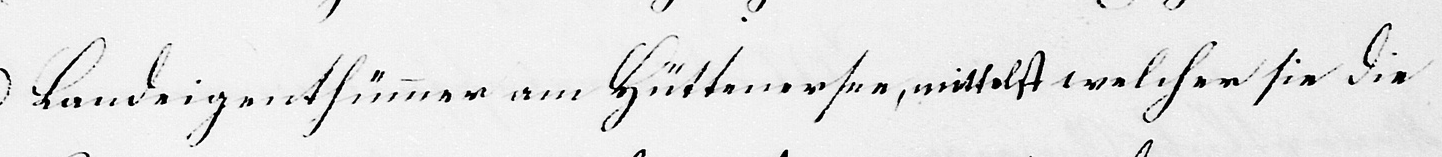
Landeigenthümmer am Hüttenersee, mittelst welcher sie die
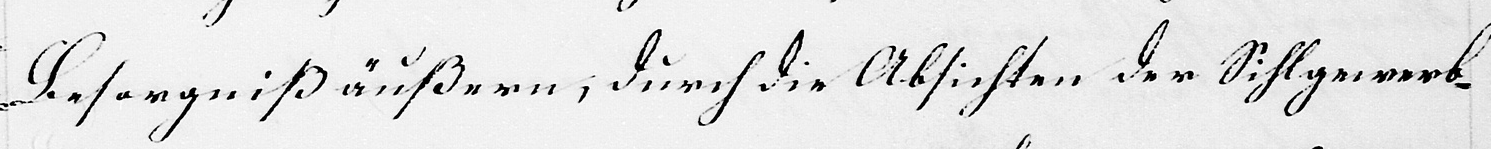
Besorgniß äußern, durch die Absichten der Sihlgewerb¬
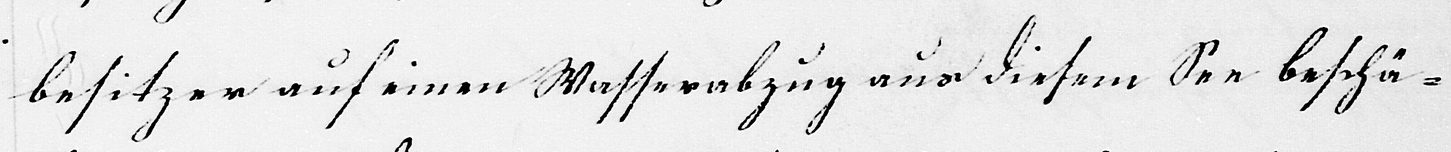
besitzer auf einen Wasserabzug aus diesem See beschä¬
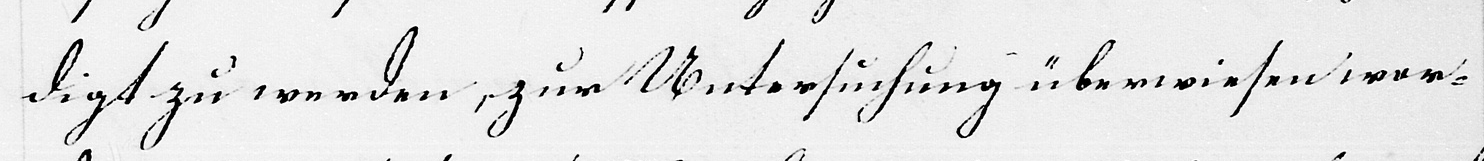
digt zu werden, zur Untersuchung überwiesen wor¬
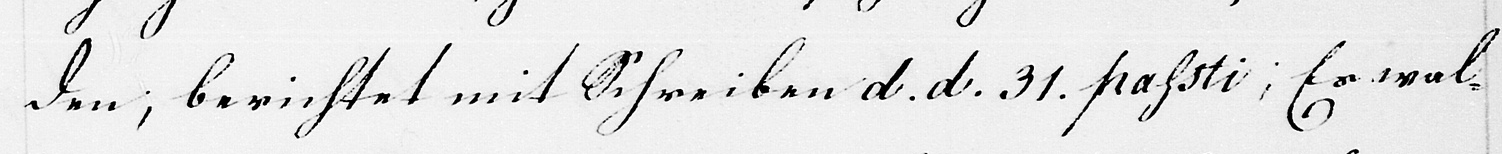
den, berichtet mit Schreiben d. d. 31. pass[a]ti; Es wal¬
